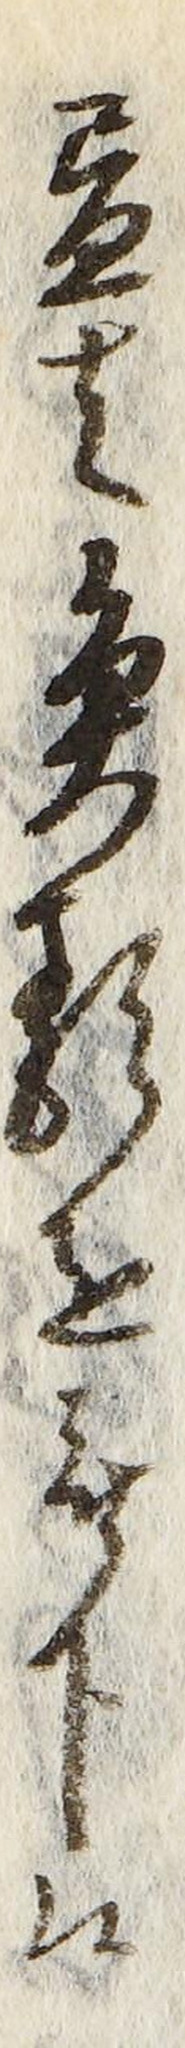晝者𩵋類を被下候
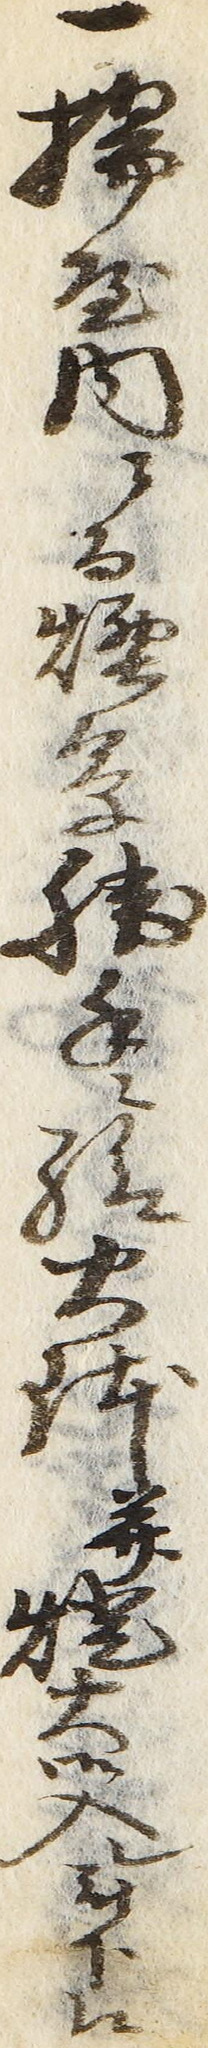一揚屋内ニ而煙草勝手ニ給火鉢幷燈火御入レ被下候
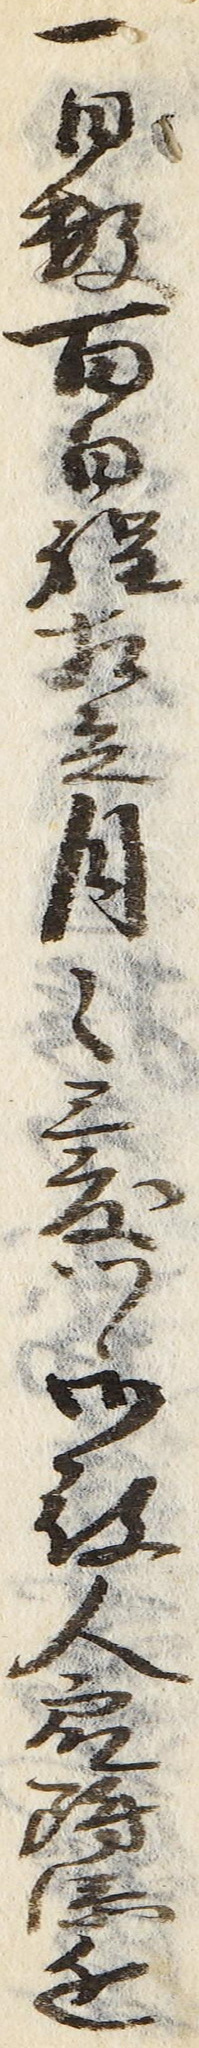一日数百日程相立月々三度ツヽ御役人衆附添近
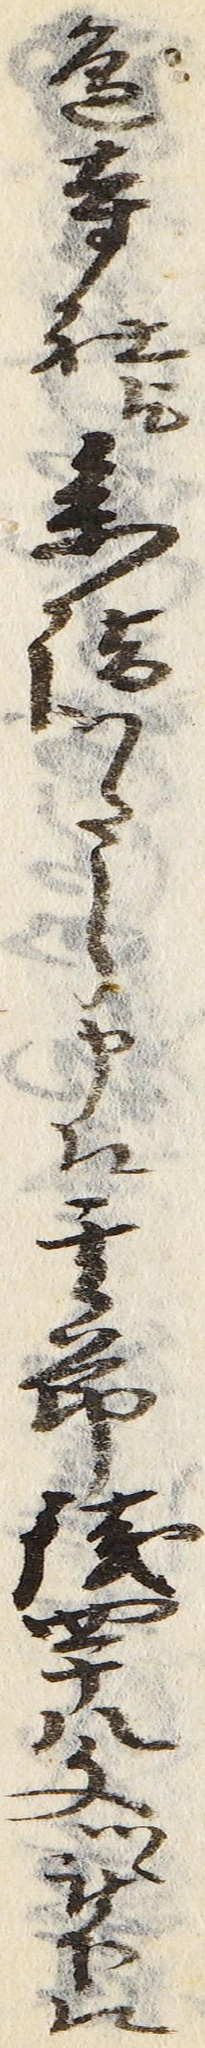邊寺社江参詣いたし申候其節銭四十八文ツヽ被下候
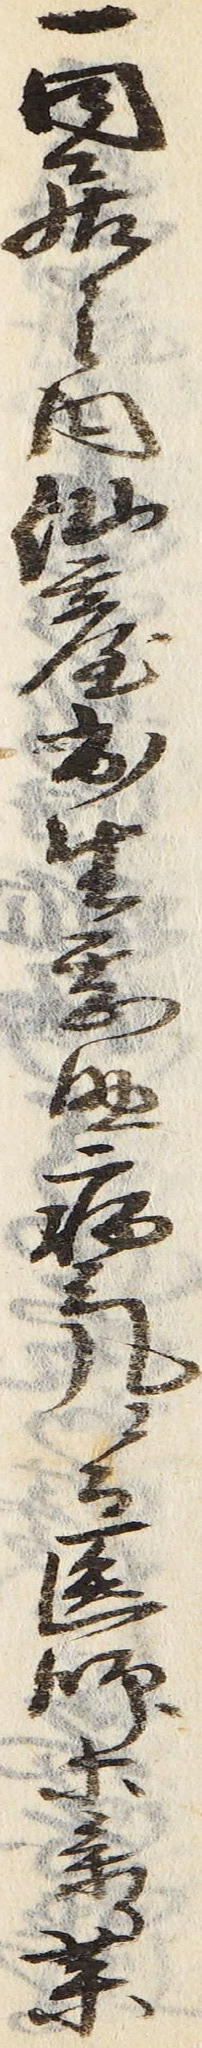一同居之内仙臺出生甚助病気ニ而医師等参り薬
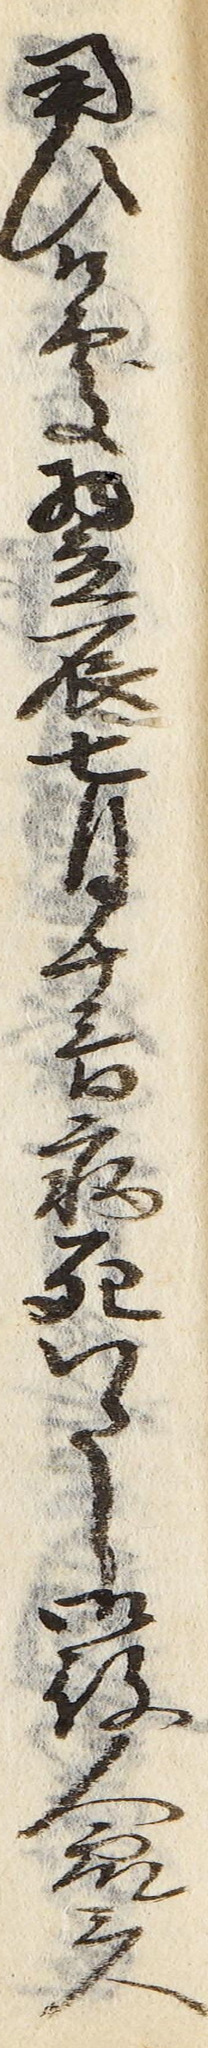用ひ候處翌辰七月十三日病死いたし御役人衆三人
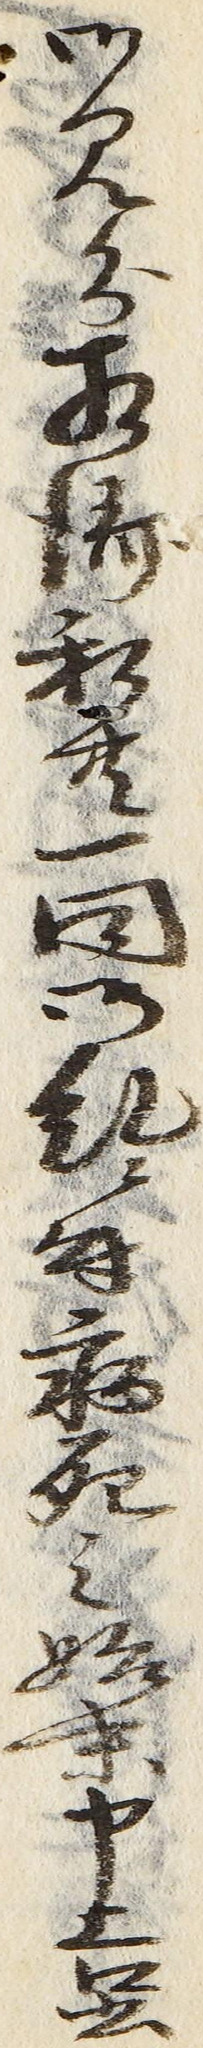御見分相濟私共一同御糺ニ付病死之始末申上口書
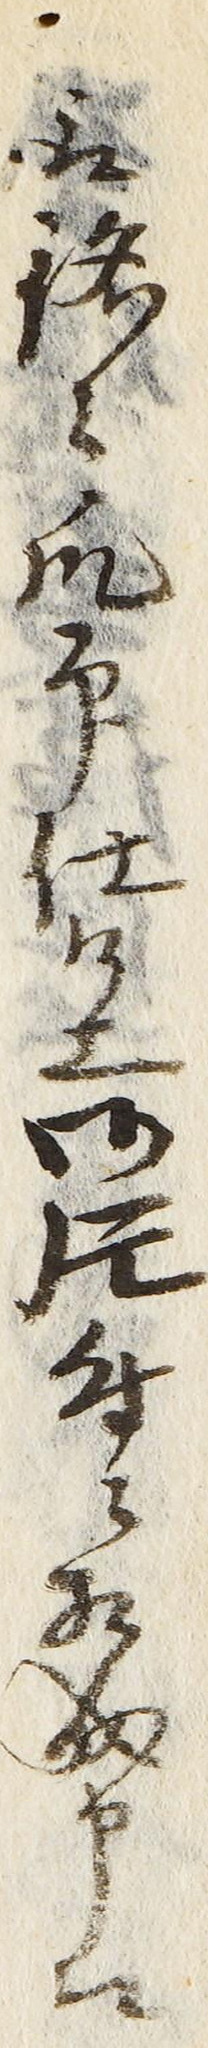取銘々爪印仕候上御片付ニ相成申候
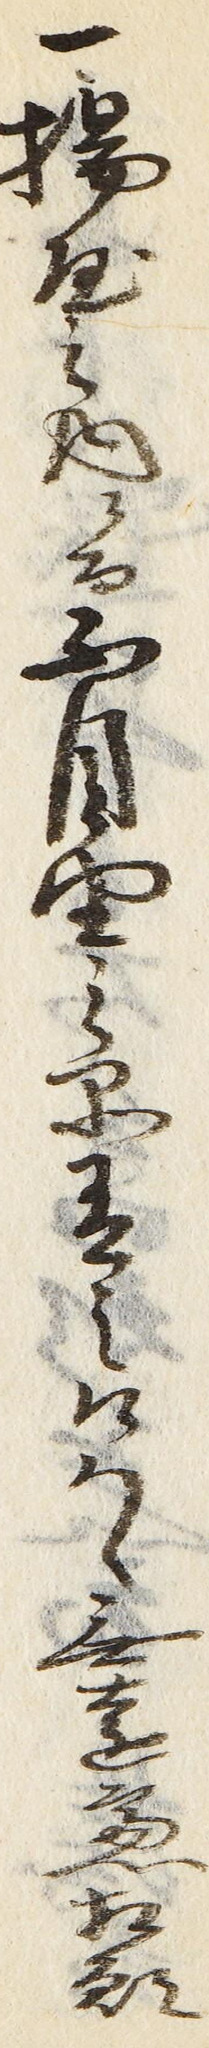一揚屋之内ニ而不自由之品有之候ハヽ無遠慮相願
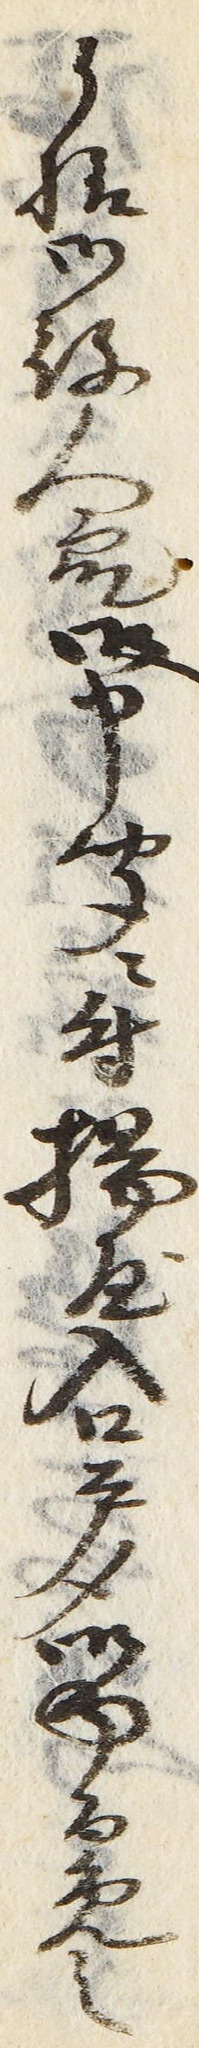候様御役人衆御申聞二付揚屋入口戸〆御ゆるめ之
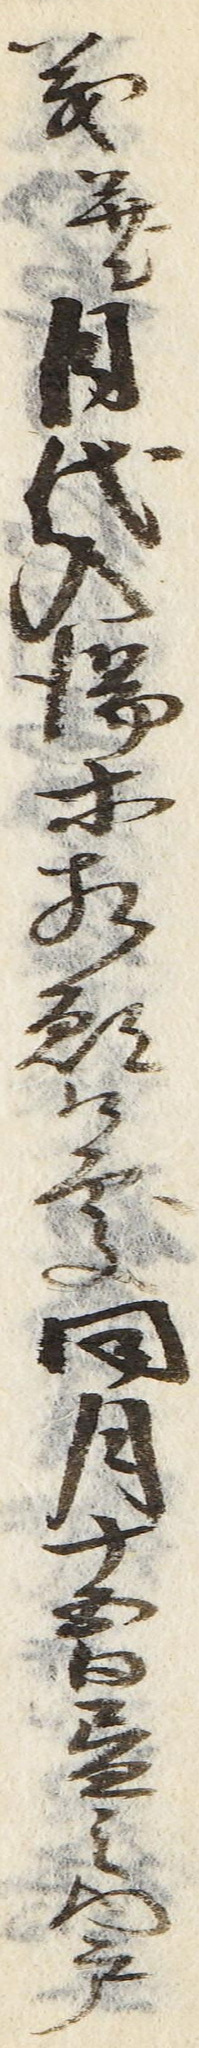義幷ニ月代入湯等相願候處同月十五日晝之内戸
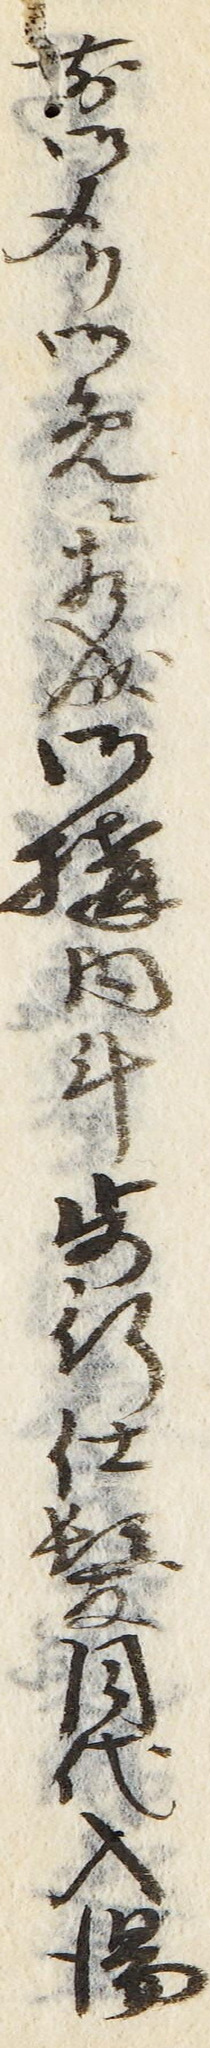前御〆ク御免ニ相成御構内斗歩行仕髪月代入湯
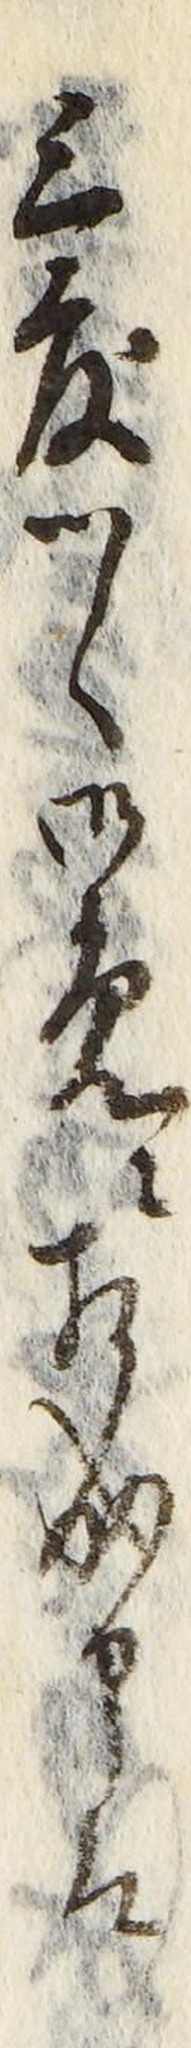三度ツヽ御免ニ相成申候
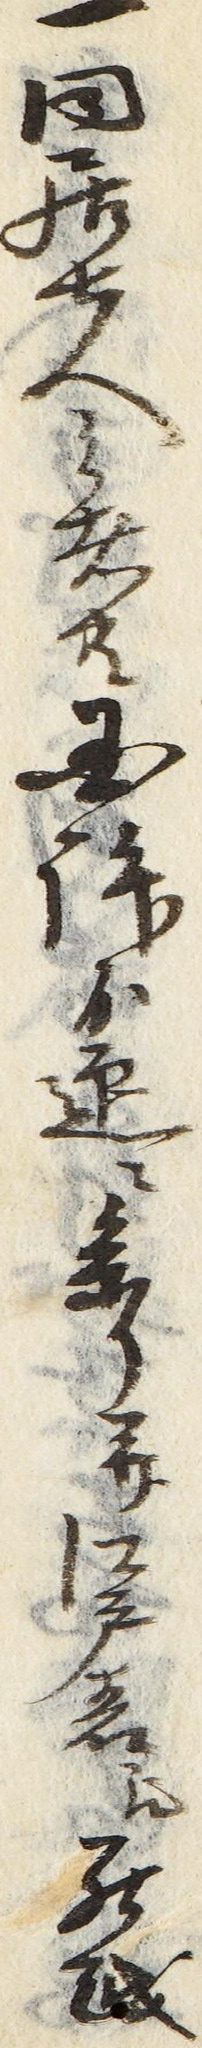一同居七人之者共国許ゟ迎ニ参り幷江戸表江罷越

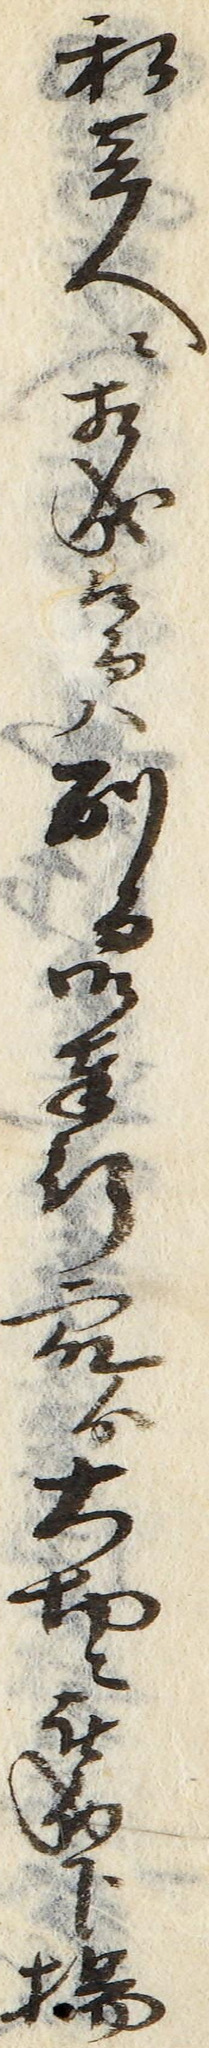私壱人ニ相成候而ハ別而御奉行衆ゟ大切ニ被成下揚
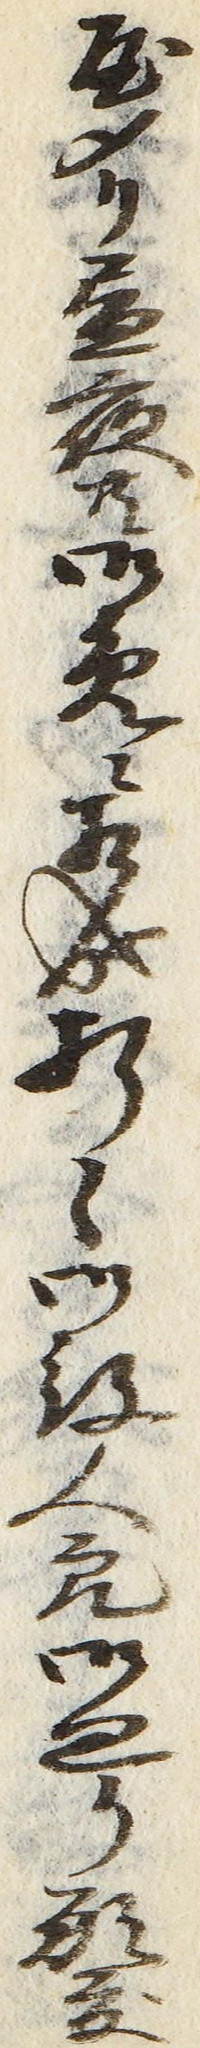屋〆り晝夜共御免ニ相成折々御役人衆御廻り願敷
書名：漂流人善助聞書
